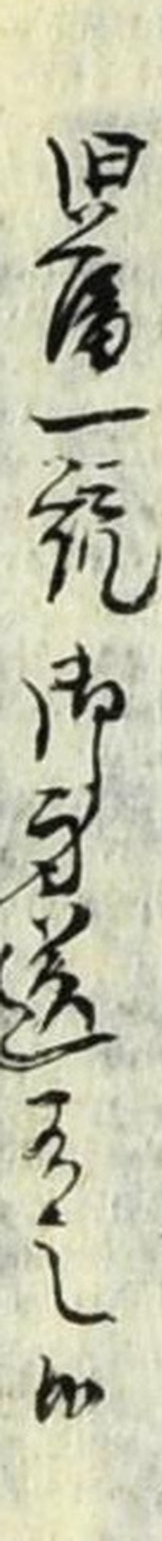旧藩一統御身送有之候
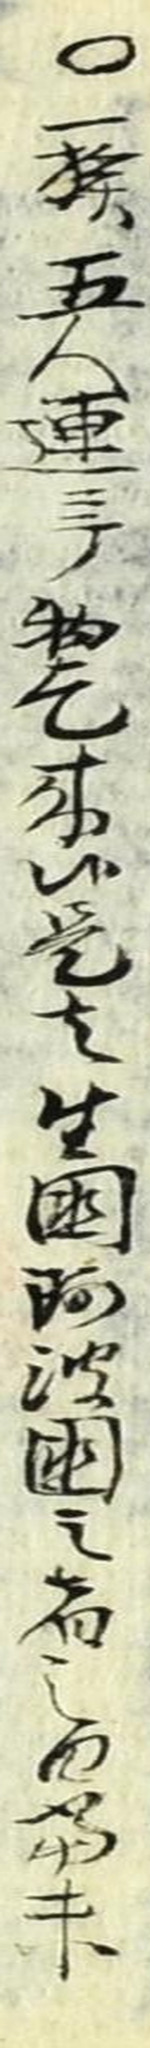○一族五人連ニテ物乞来候是ハ生国阿波国之者之由当未
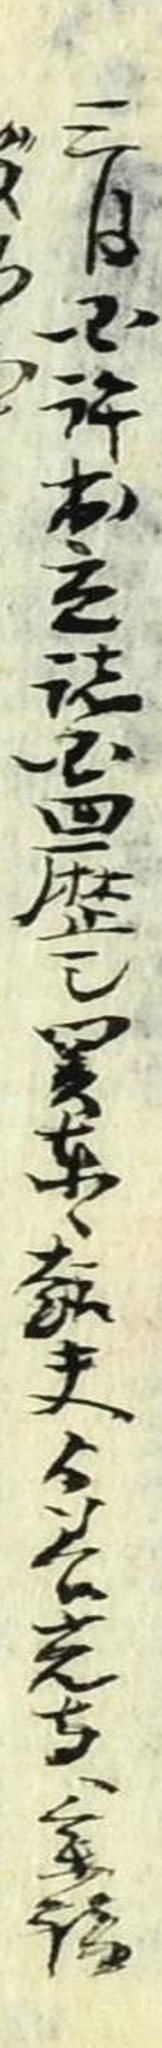三月国許出立諸国回歴シ関東へ趣夫ゟ善光寺へ参詣
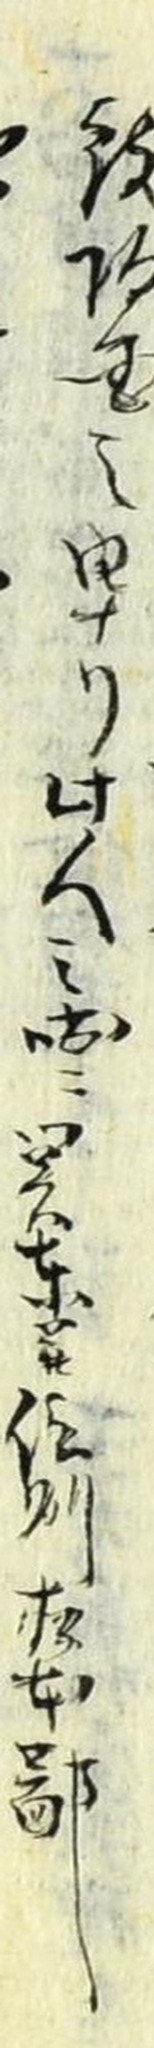致帰国之由ナリ此人之咄ニ関東幷信州松本鄙
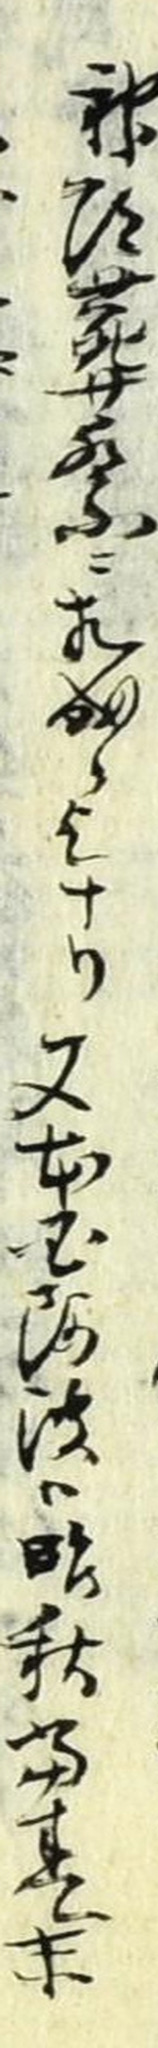神道葬祭ニ相成り与ナリ又本国阿波ハ昨秋当春末
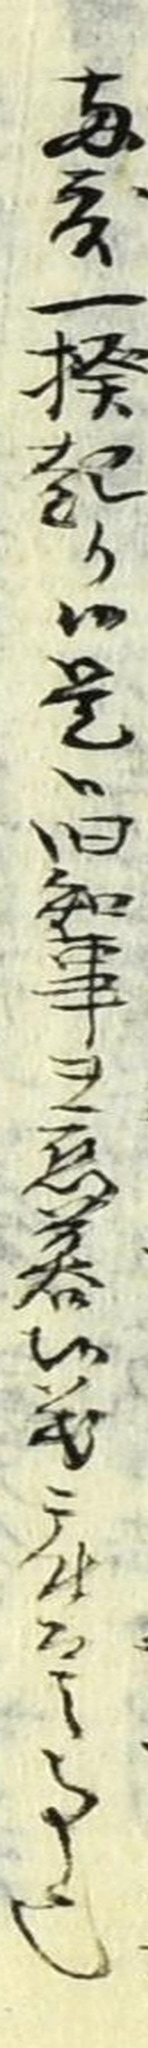両度一揆起り候是は旧知事ヲ恋暮候義ニ付而之事也
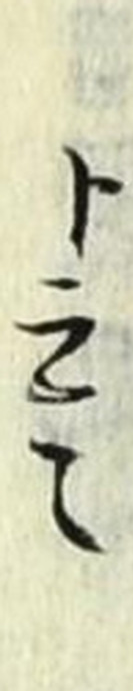ト云々
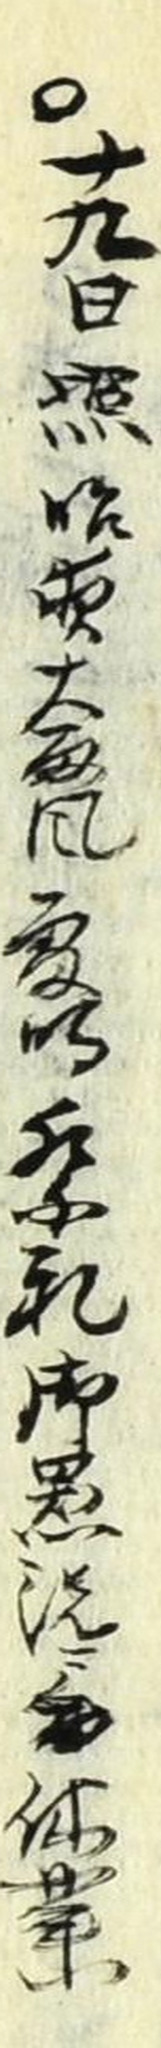○十九日照昨夜大雨風雷鳴祭礼御器洗ニ而休業
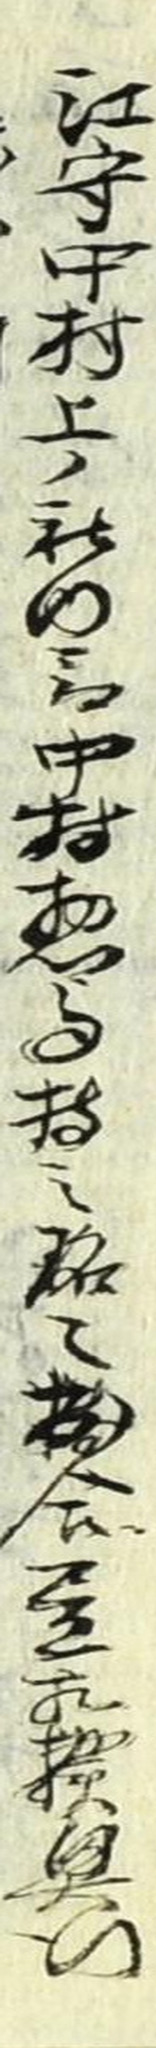江守中村上ノ社内ニ而中村惣高持之銘々出合昼相撲興行
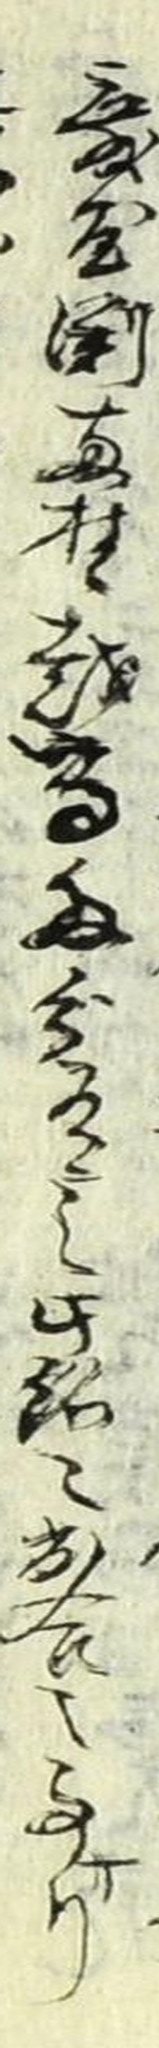舞屋淵両村へ越高多分有之此銘々出合之事ナリ
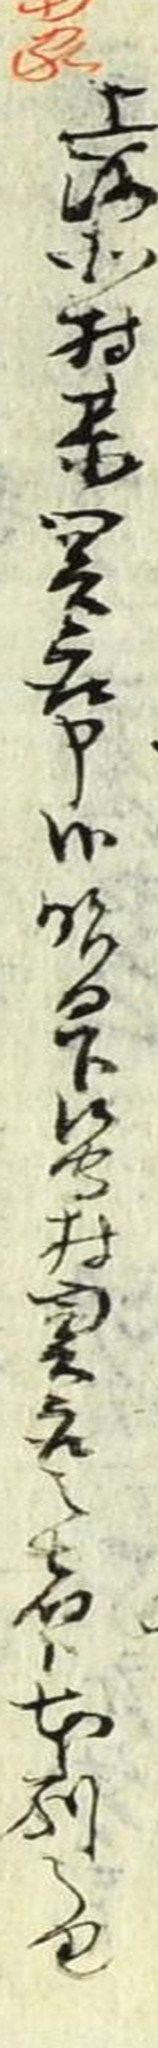上河北村某関取申候昨日下江守村関取之者ト本副之由
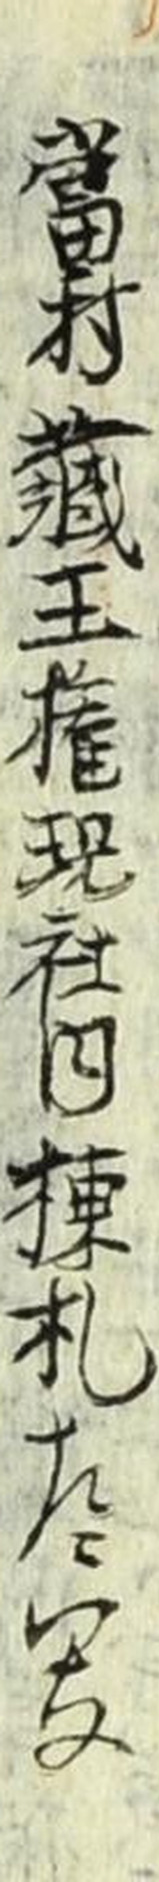当村蔵王権現社内棟札左ニ写
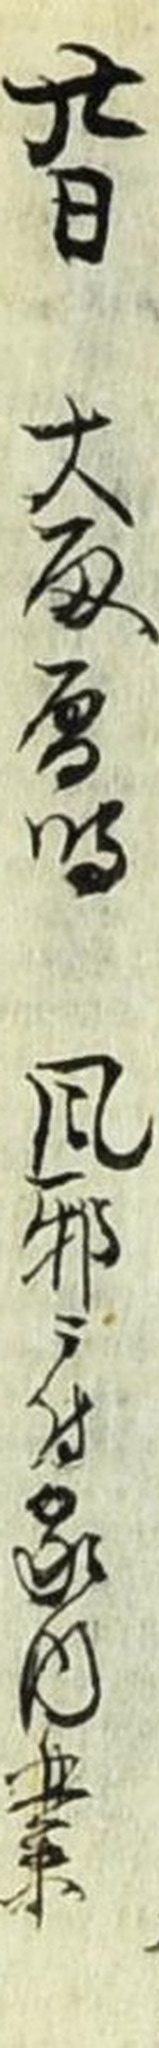廿日大雨雷鳴風邪ニ付家内業
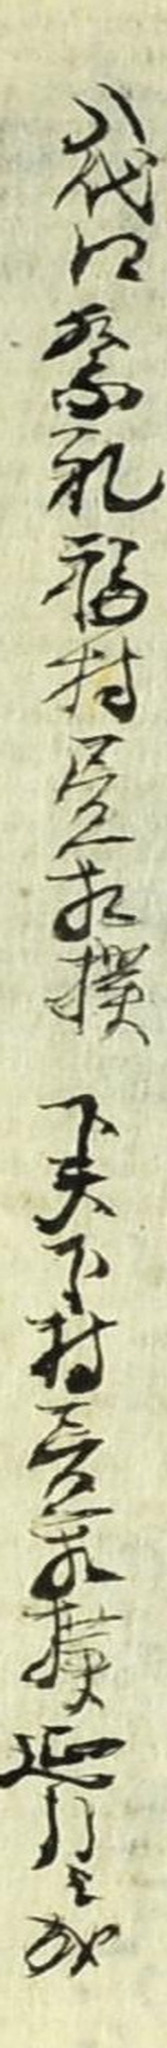八代郷祭礼福村昼相撲下天下村昼相撲延引与成
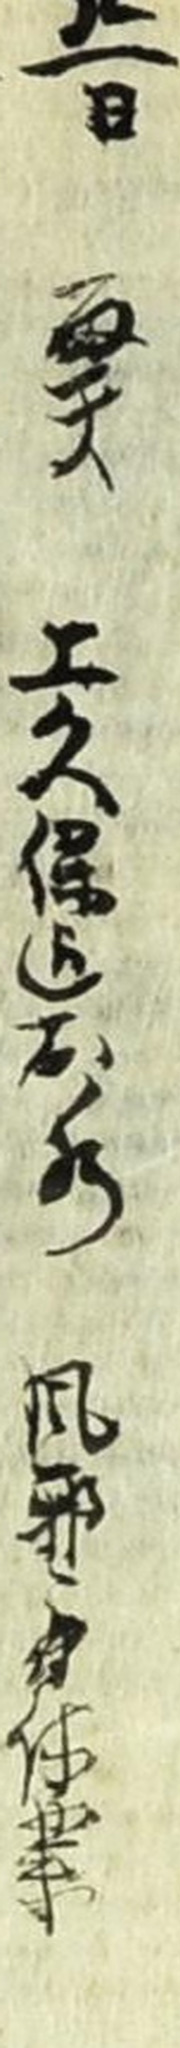廿一日雨天上久保迄出水風邪ニ付休業
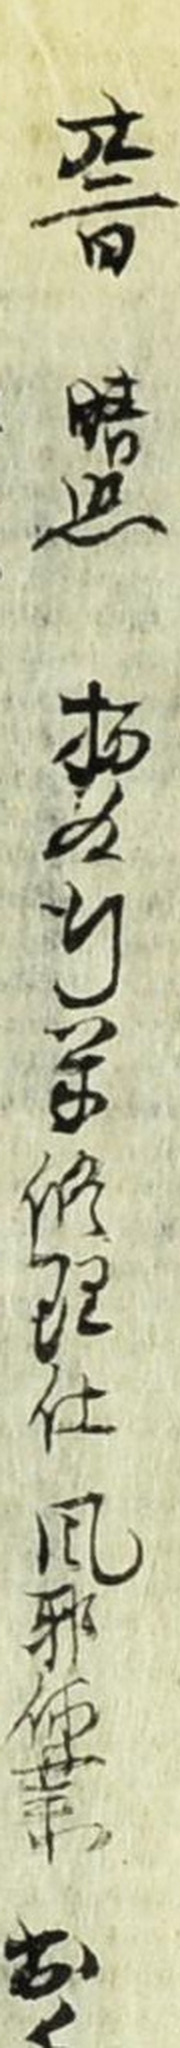廿二日晴照栃谷行米修理仕風邪休業出水引潮
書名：（日記）
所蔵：福井県文書館 Fukui Prefectural Archives
